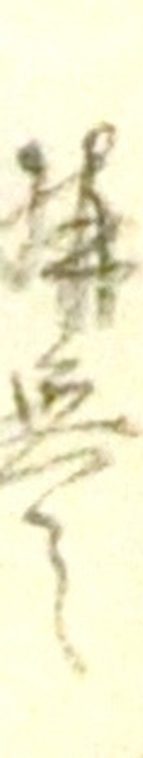構無之
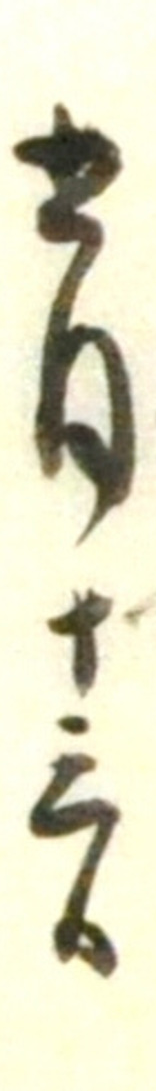五月十三日
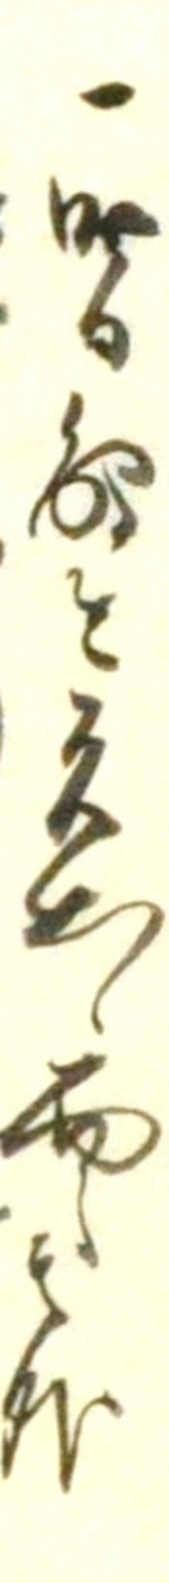一昨日触を差出候面々其外
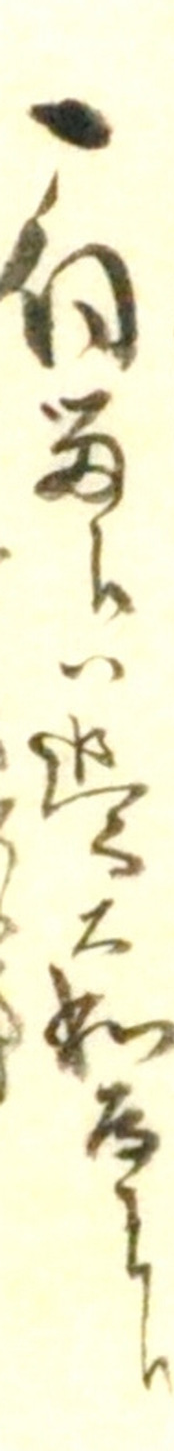一伺留えは追て大和殿より
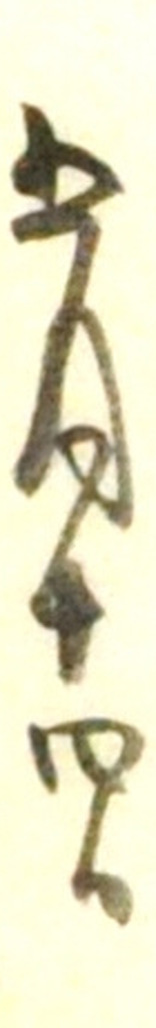五月十四日
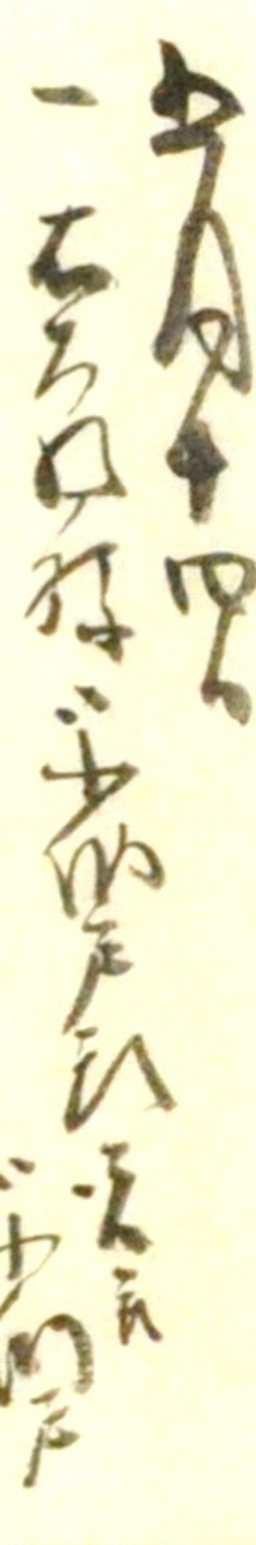一右大将様御小納戸頭取并御小納戸
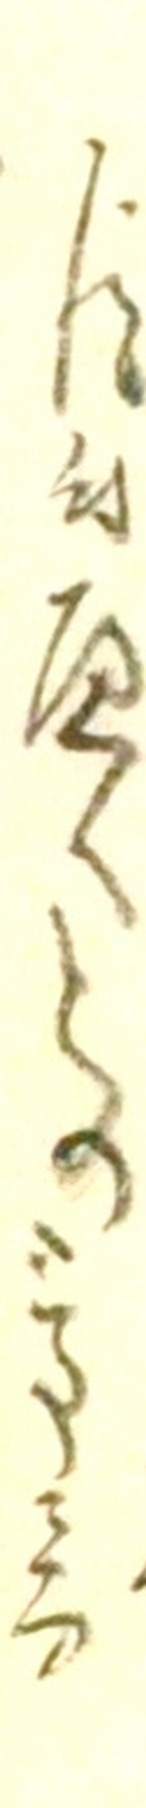被仰付へくとの御事にて
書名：万覚
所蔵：伊那市立高遠町図書館・合同会社AMANE
